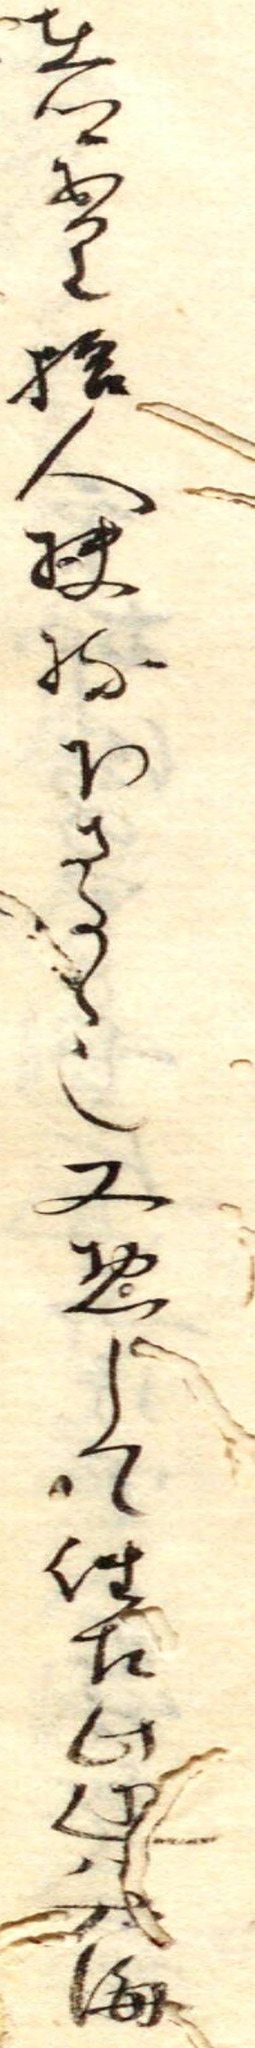在郷あり拾人ふ扶持下さる也又惣して往古此辺は入海
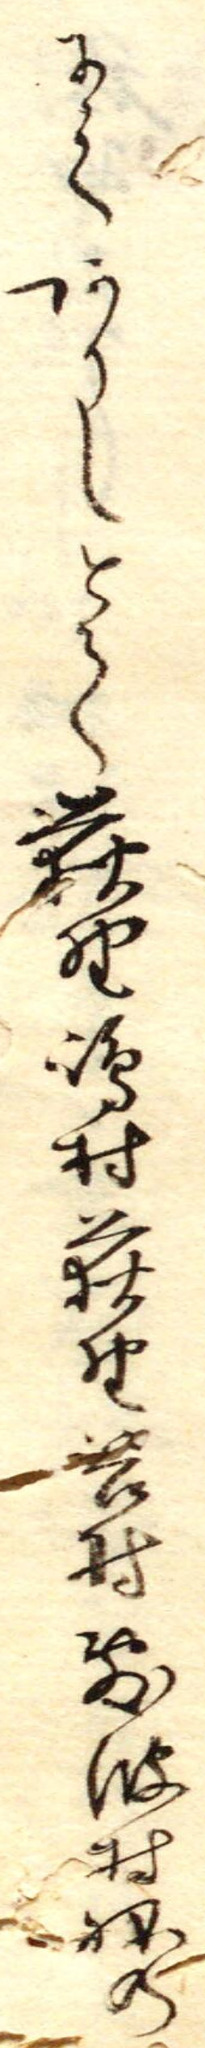にてありしとて荻野嶋村萩野谷村敷波村抔の
